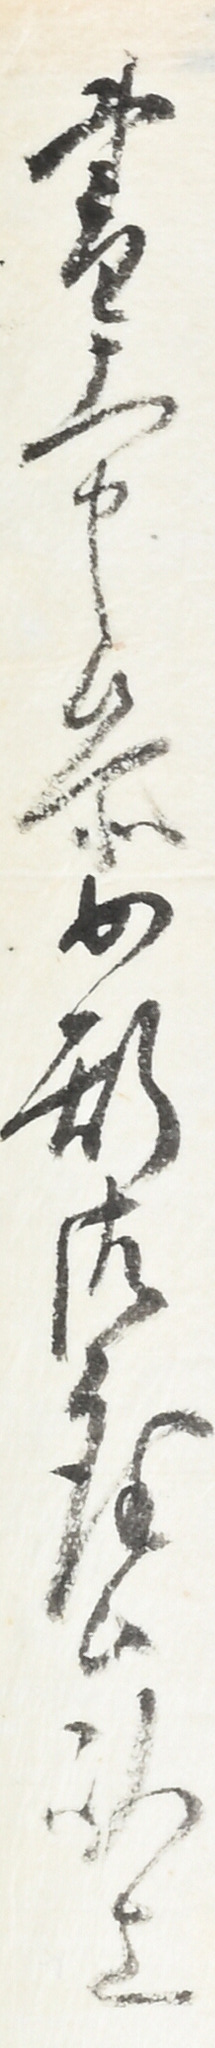書上申候所如斯御座候以上

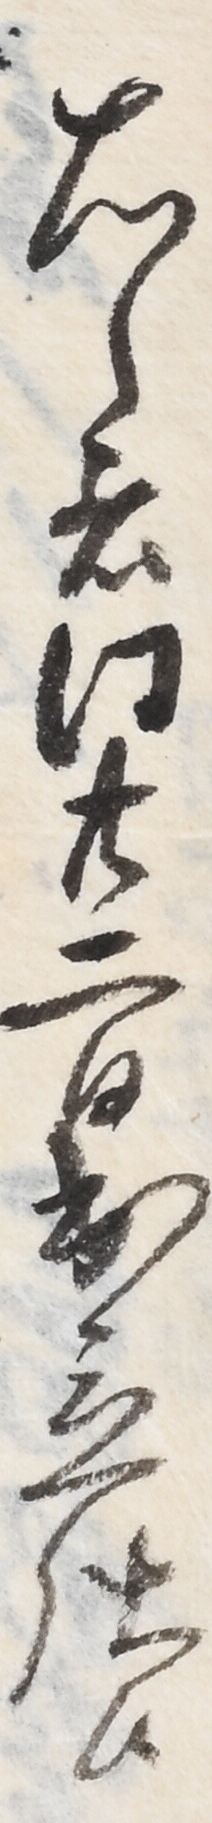右之者同八日出立仕候
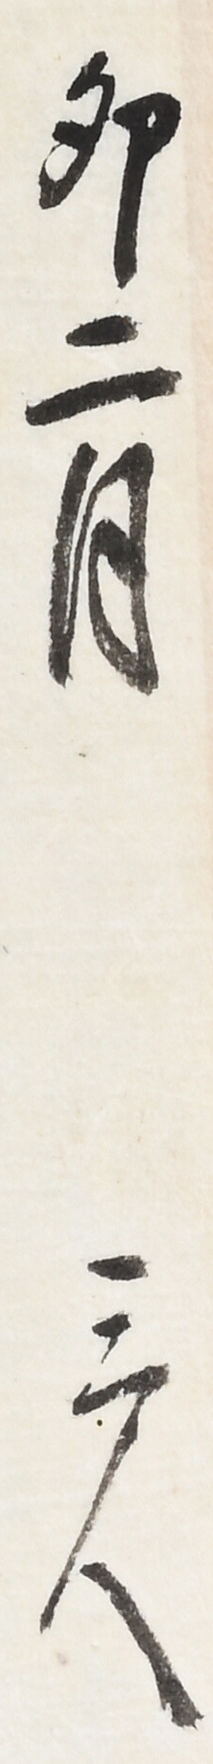卯二月三人
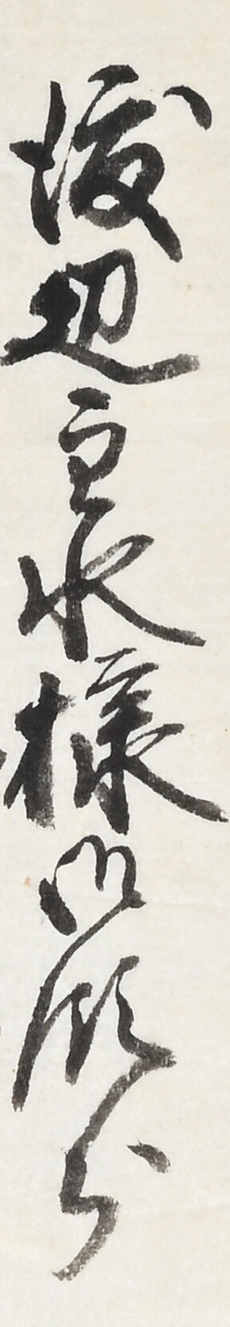渡辺主水様御領分
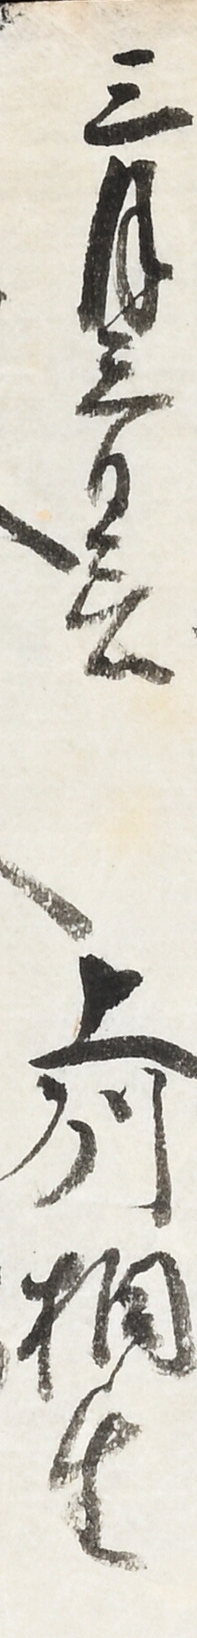三月三日着上州桐生
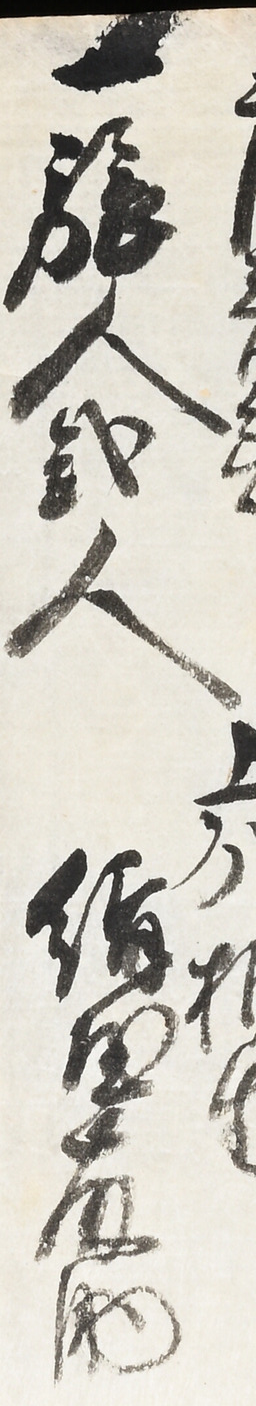一旅人弐人絹屋藤助
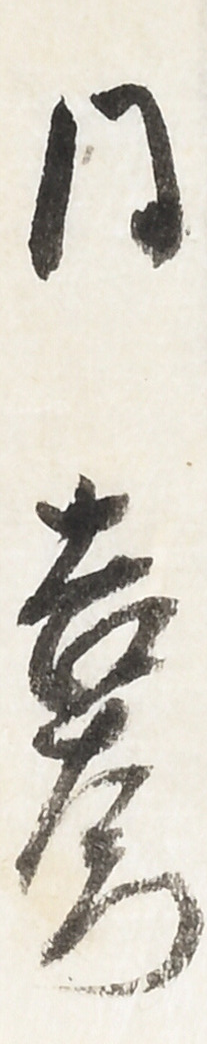同吉右衛門
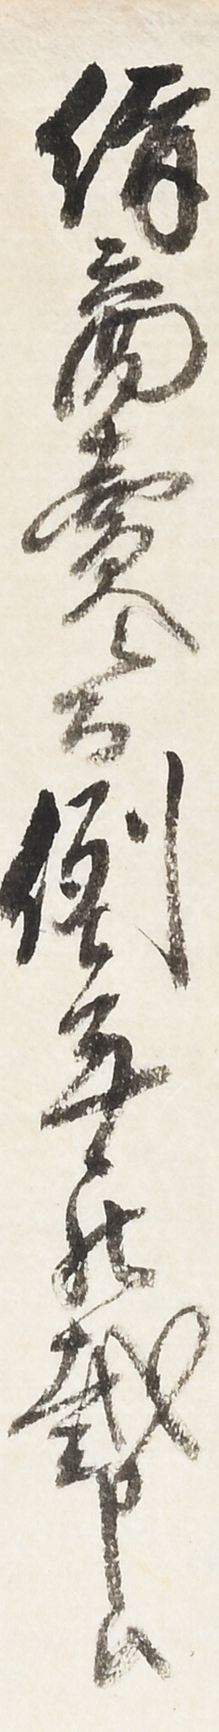絹商売ニ而例年罷越申候
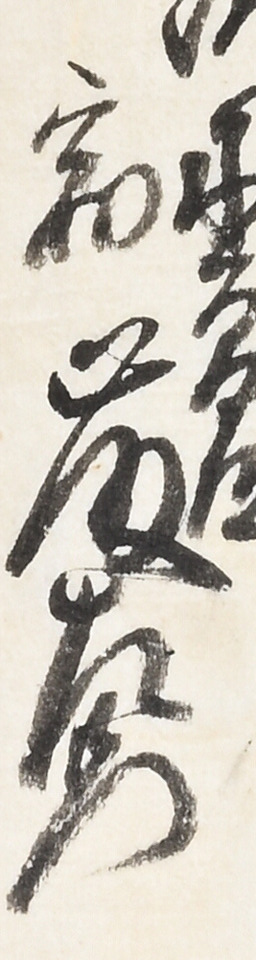宿籐左衛門
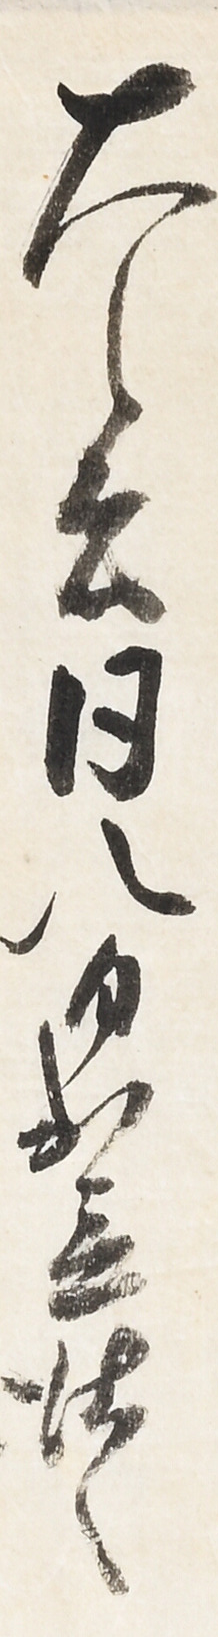右之者同八日出立仕候
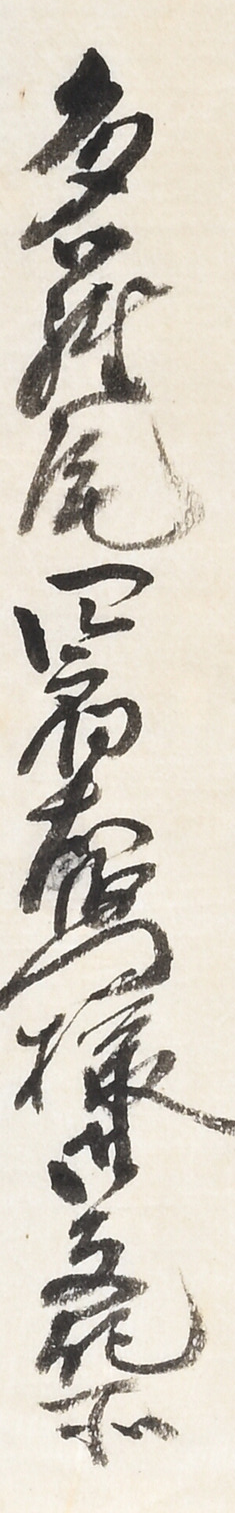多羅尾四郎右衛門様御支配所
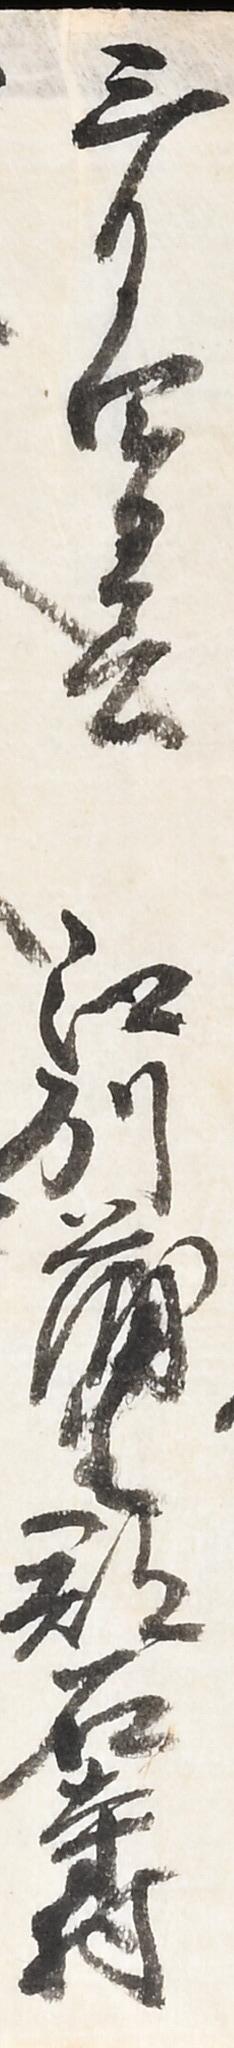三月四日着江州蒲生郡石寺村
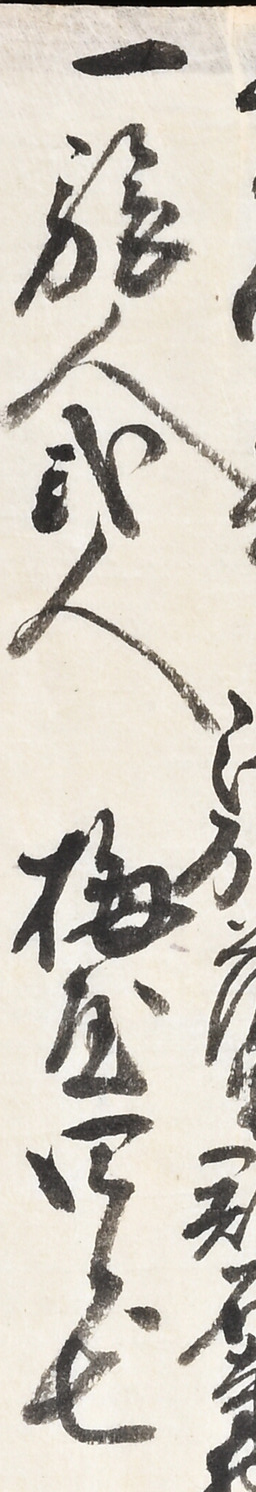一旅人弐人梅屋四郎七
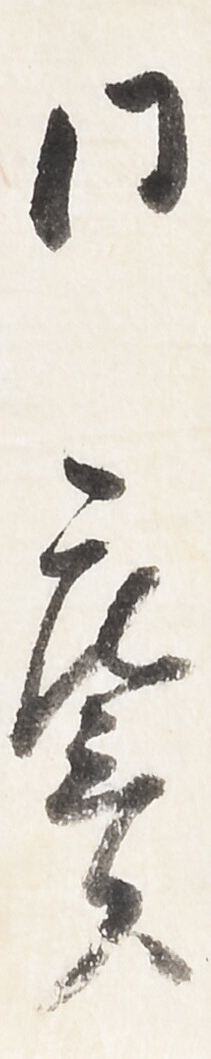同庄三郎
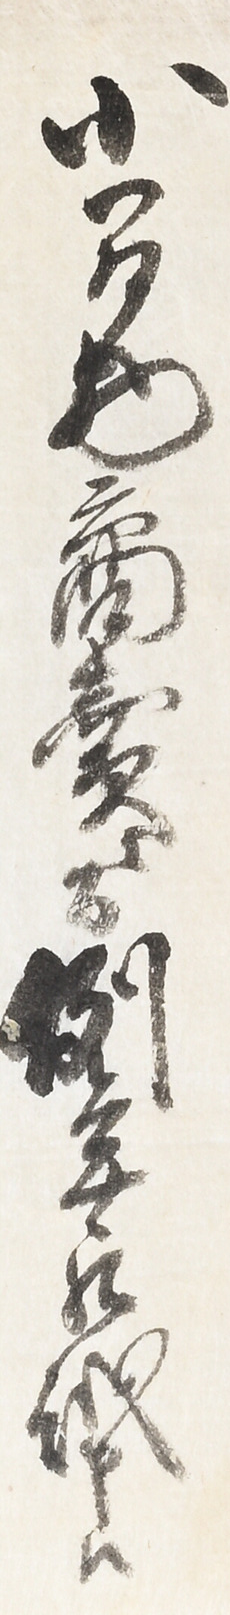小間物商売ニ而例年罷越申候
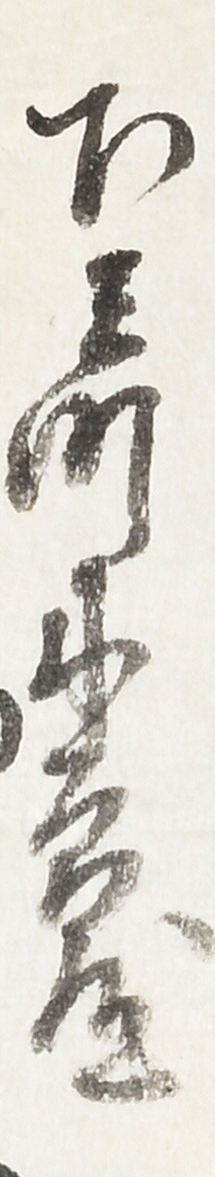下モ町木曽屋
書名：旅人泊控帳
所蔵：伊那市立高遠町図書館・合同会社AMANE
